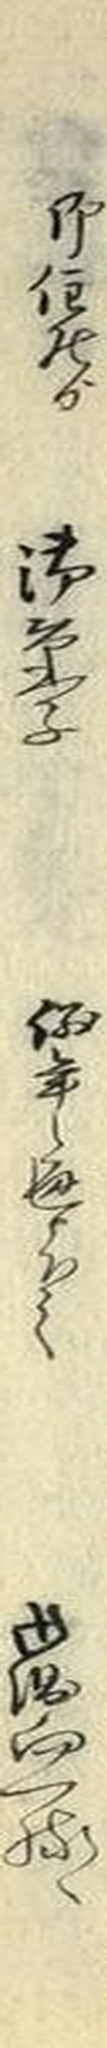御住居ゟ御菓子例年之通被下之御側向一統へ
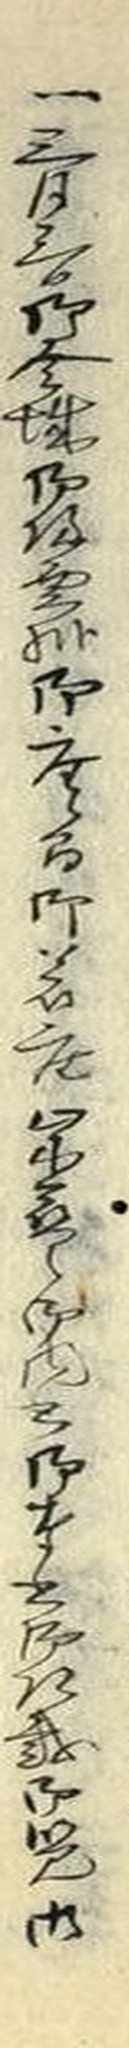一三月三日御登城御帰殿掛御座之間御着座歳暮之御内書御奉書御頂戴御覧御
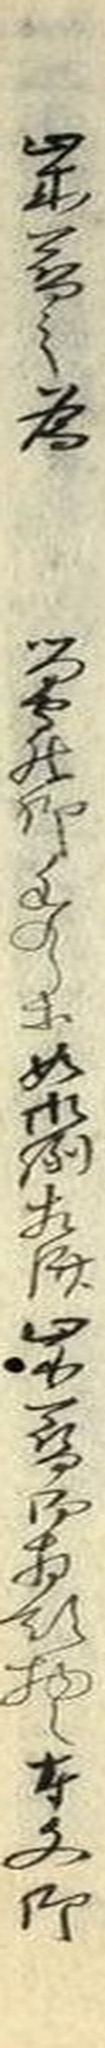歳暮之為留守居御手のし等如御例相済歳暮御拝領物之奉文御
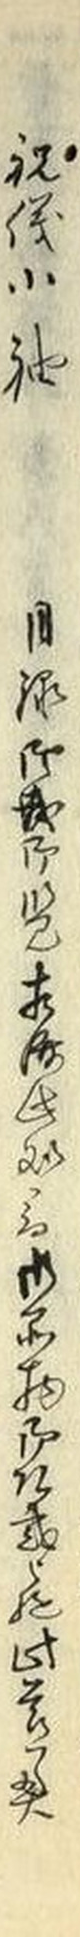祝儀小袖目録御戴御覧相済此処ニ而御品物御頂戴被遊此節奥
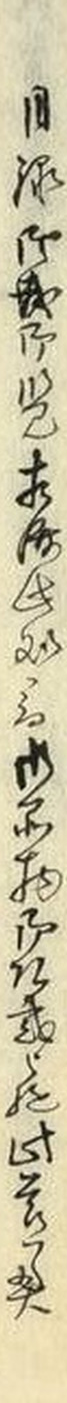祝儀小袖目録御戴御覧相済此処ニ而御品物御頂戴被遊此節奥
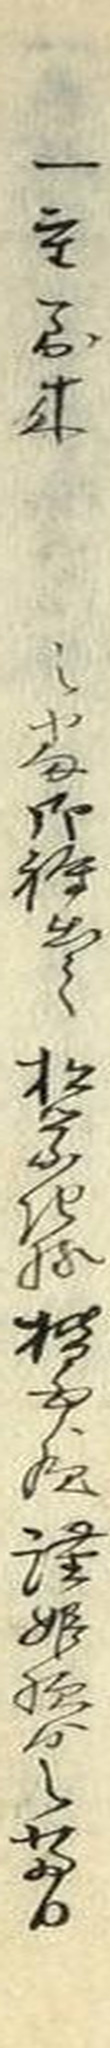一重到来之番御褥出之松栄院様楷五郎様謹姫様ゟ之当日
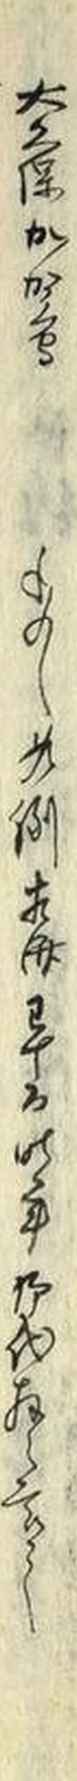大久保加賀守手のし如例相済畢而昨年御代拝之節之
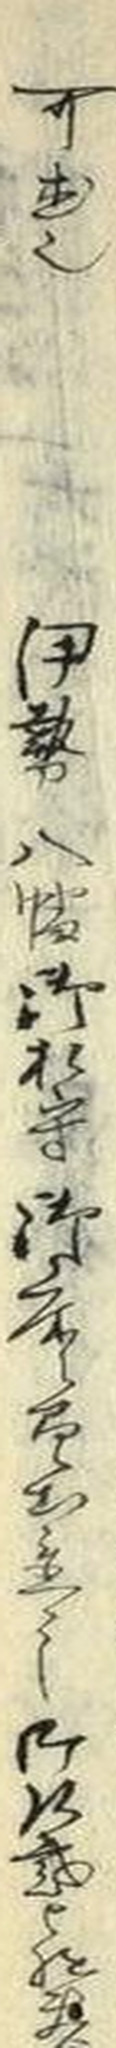可述也伊勢八幡御札守御床之間へ出置之御頂戴被遊夫ゟ
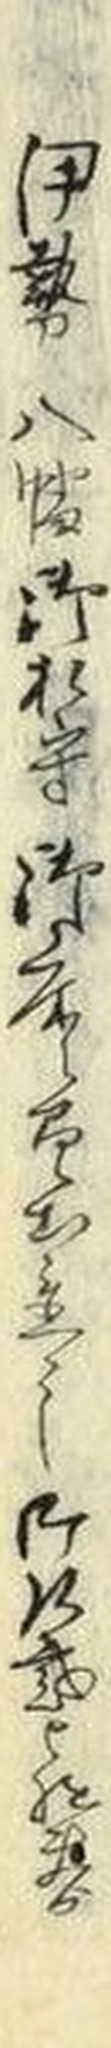可述也伊勢八幡御札守御床之間へ出置之御頂戴被遊夫ゟ
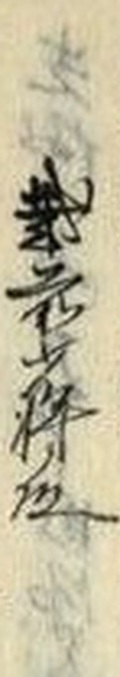越前少将殿
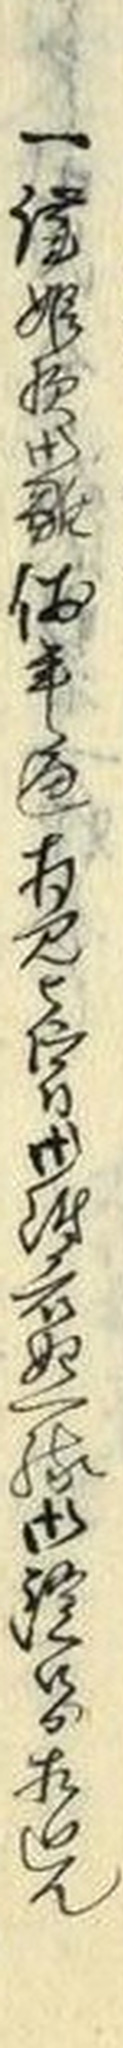一謹姫様御雛例年之通拝見被仰付御附衆始一統御錠口ゟ相廻ル
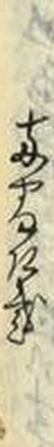両番頂戴
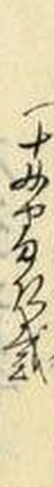両番頂戴
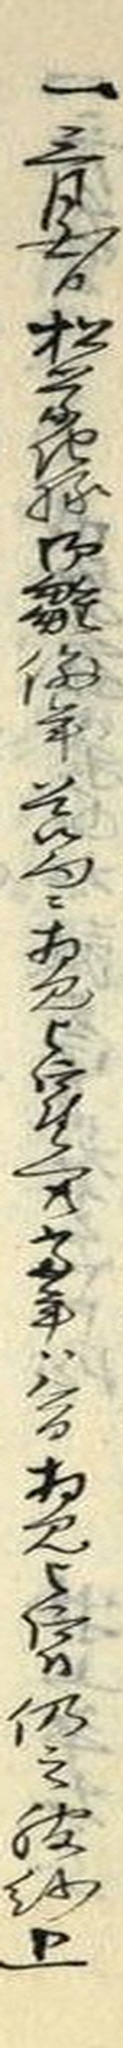一三月五日松栄院様御雛例年節句ニ拝見被仰付候へ共当年ハ今日拝見被仰付依之服紗上
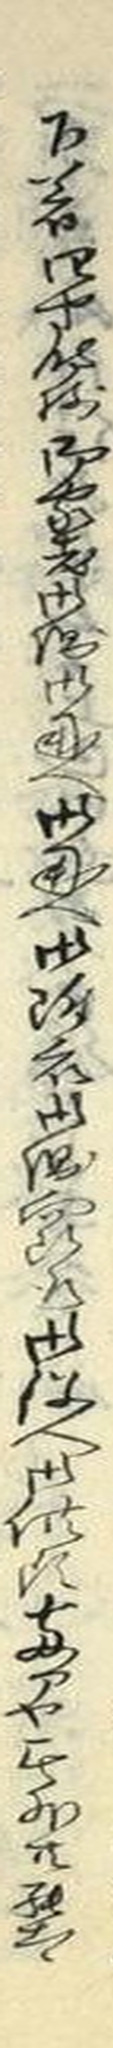下着四半時揃御家老御側御用人御用人御附衆御側向頭取御役人御供頭両部屋其外共罷出候
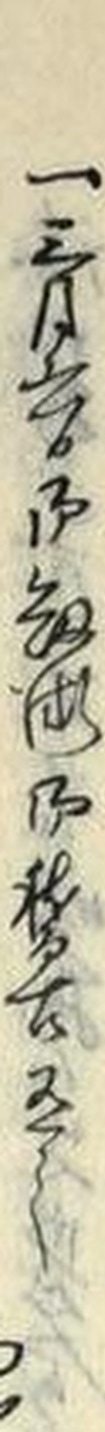一三月六日御剣術御稽古有之
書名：少傅日録抄（斉善付側向頭取日記、在府）
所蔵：福井県文書館 Fukui Prefectural Archives
